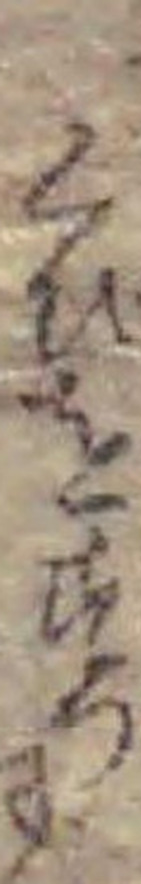くびをすつ
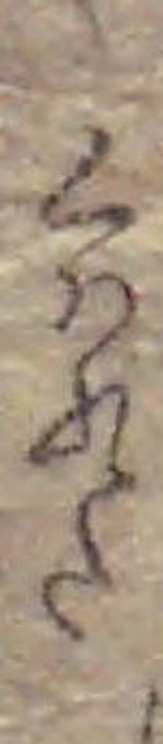くはれた
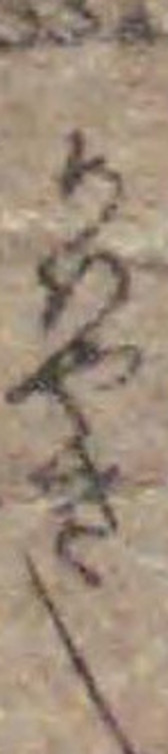かばやき
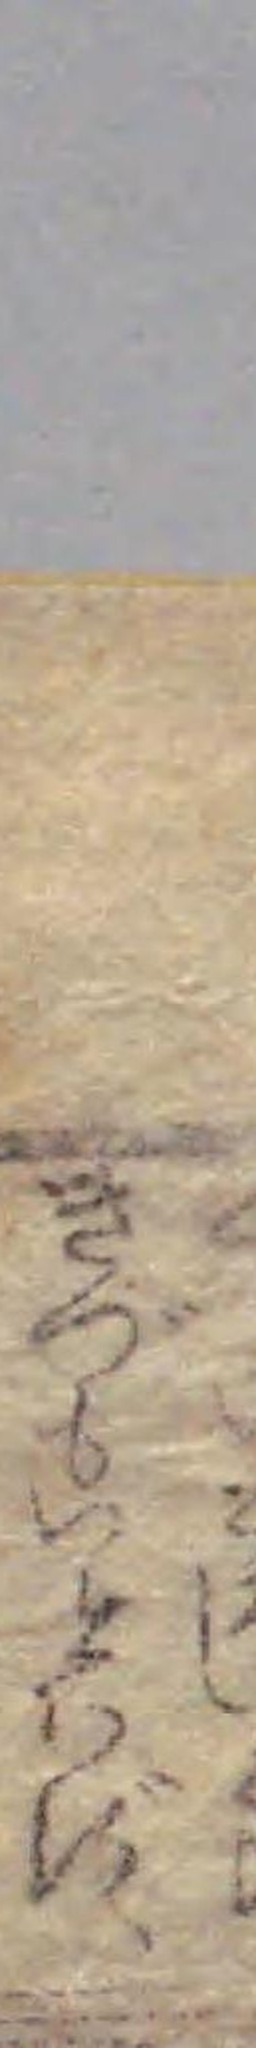きづもいとはず
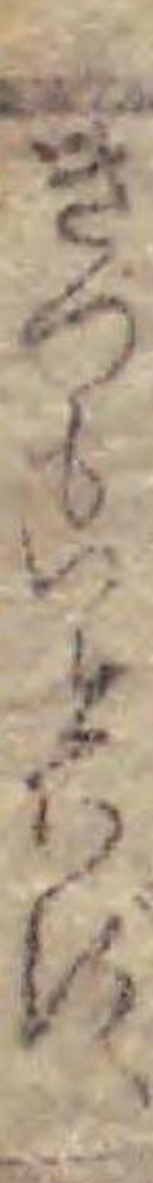きづもいとはず
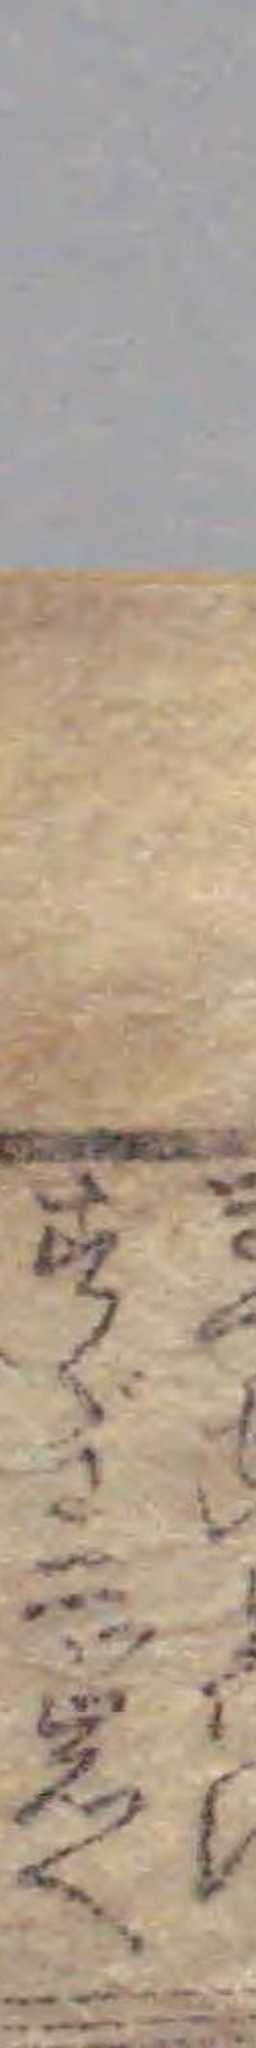すぐに二つ岩へ
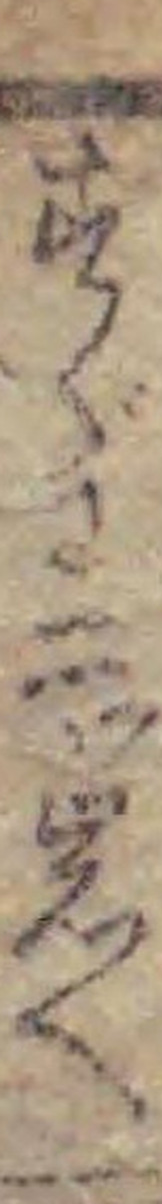すぐに二つ岩へ
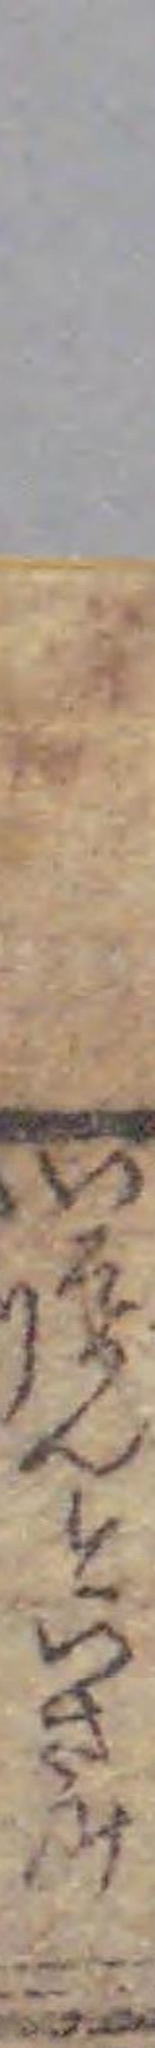いそかんといさみ
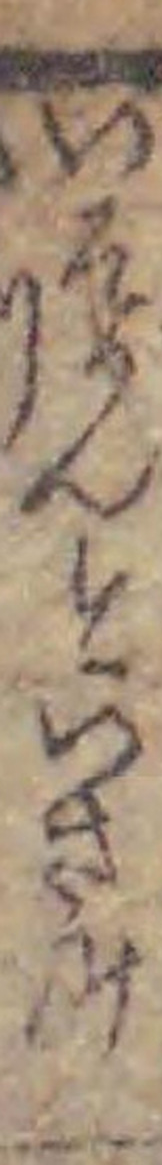いそかんといさみ

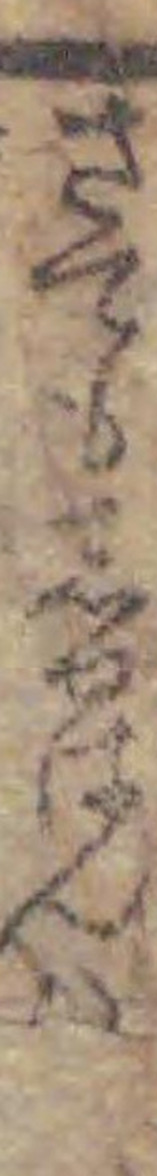さてもしゆはんは
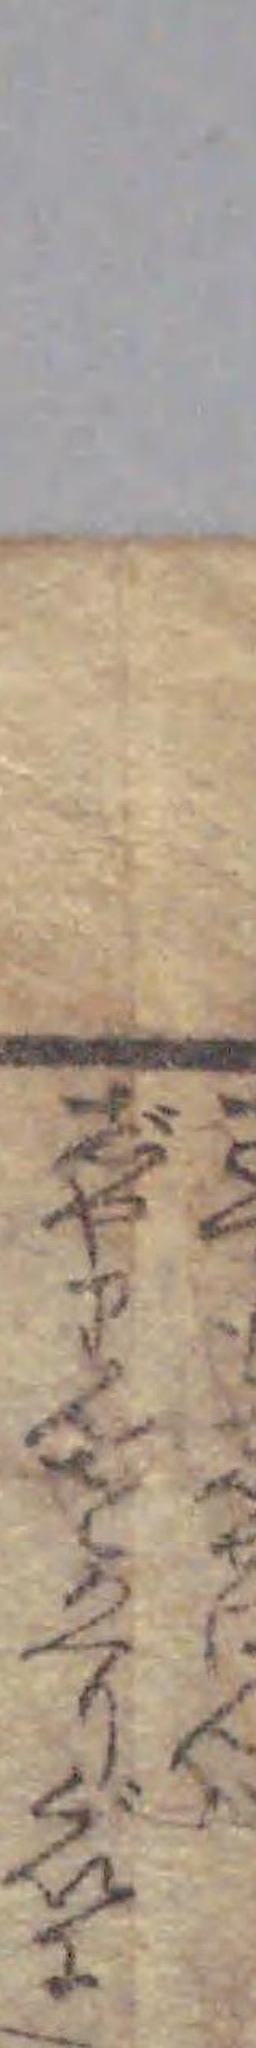じやりんをかへりぐいに
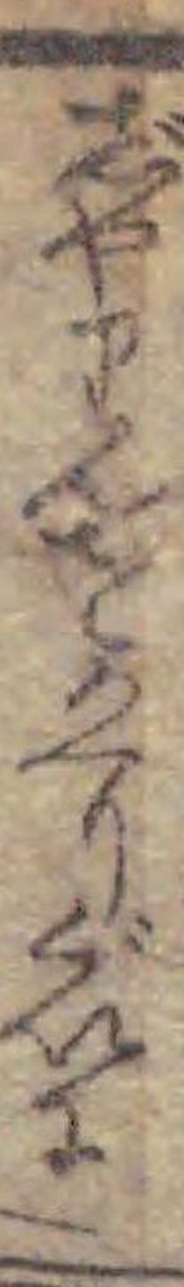じやりんをかへりぐいに
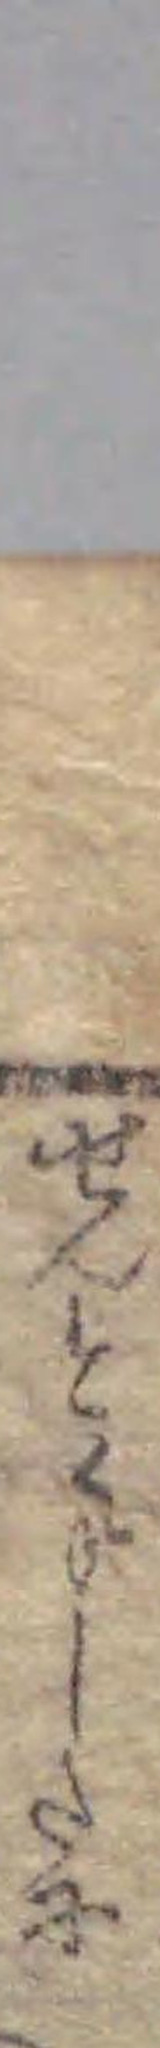せんと手したに
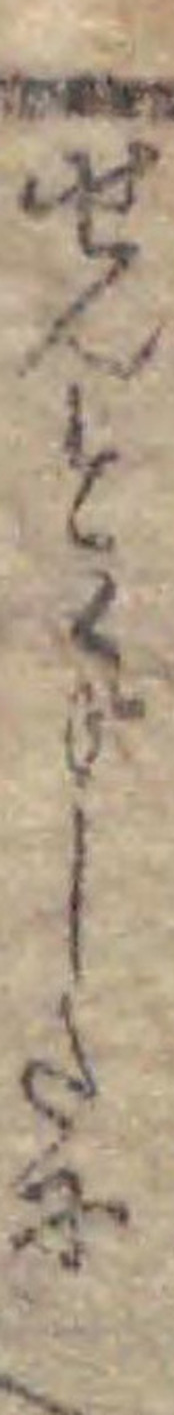せんと手したに
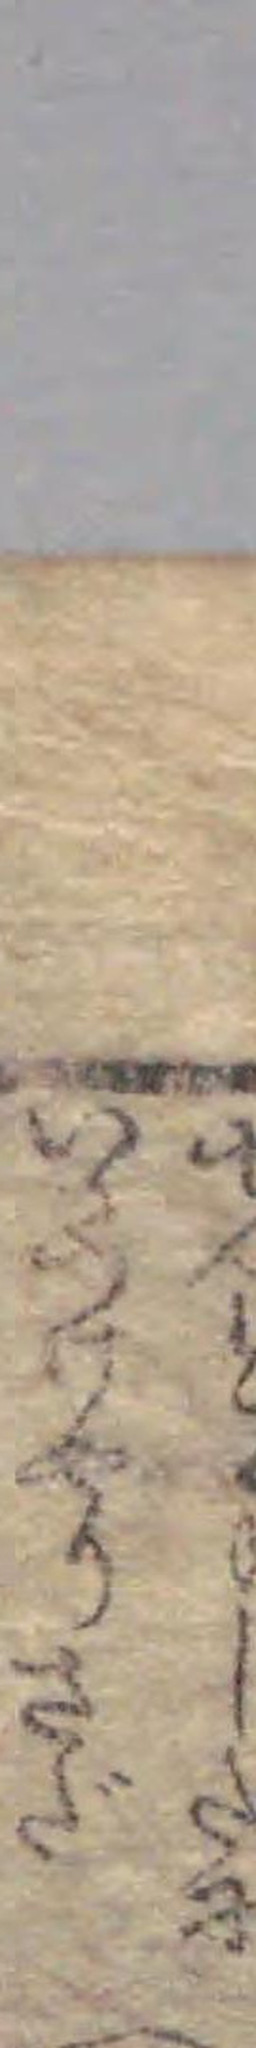いゝつけやりさだ
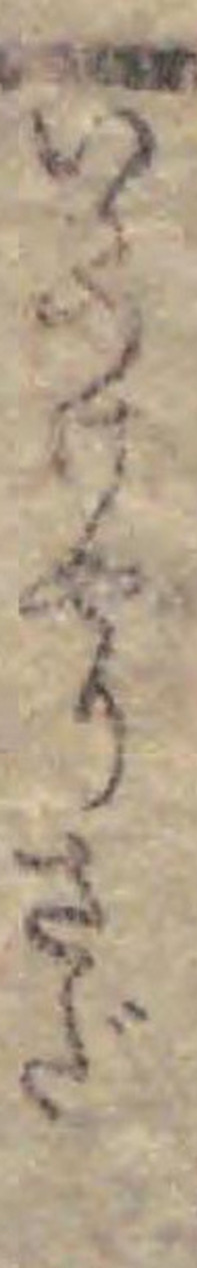いゝつけやりさだ
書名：化物世界夜半嵐 : 3巻
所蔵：国立国会図書館 National Diet Library, JAPAN
